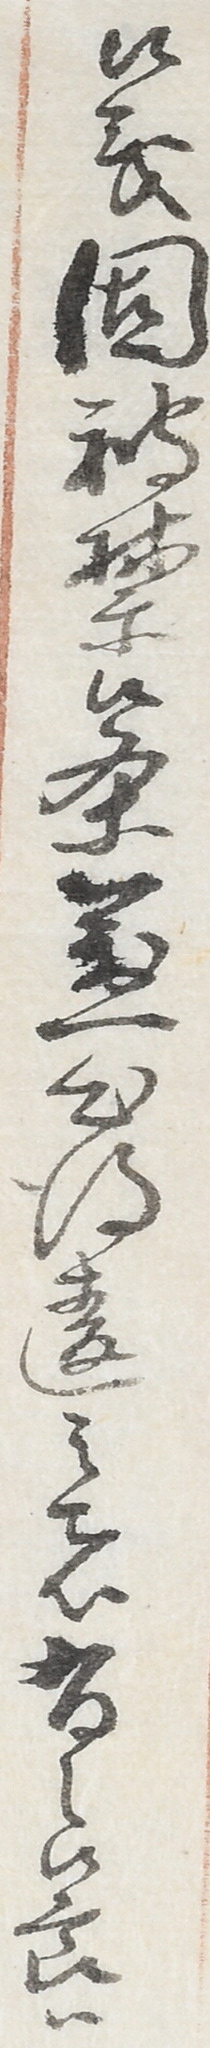候義固被禁候条万一心得違之者有之候節は
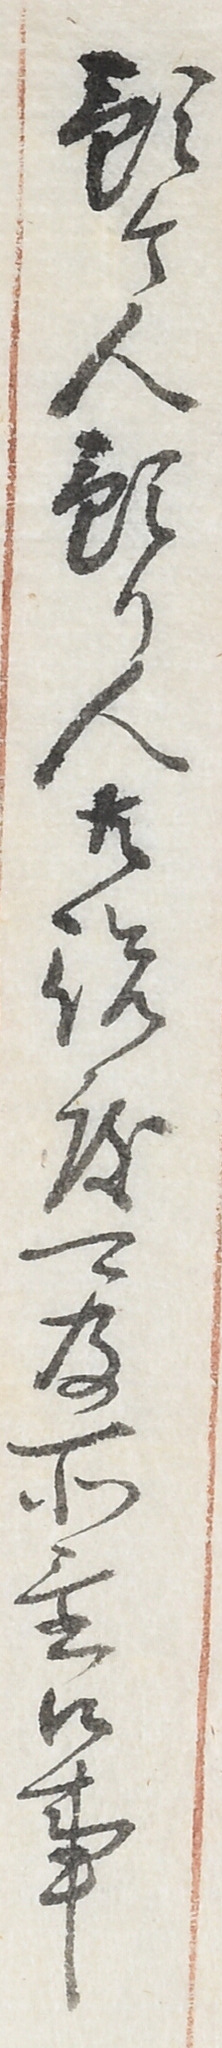預け人預り人共屹度可及所置候事
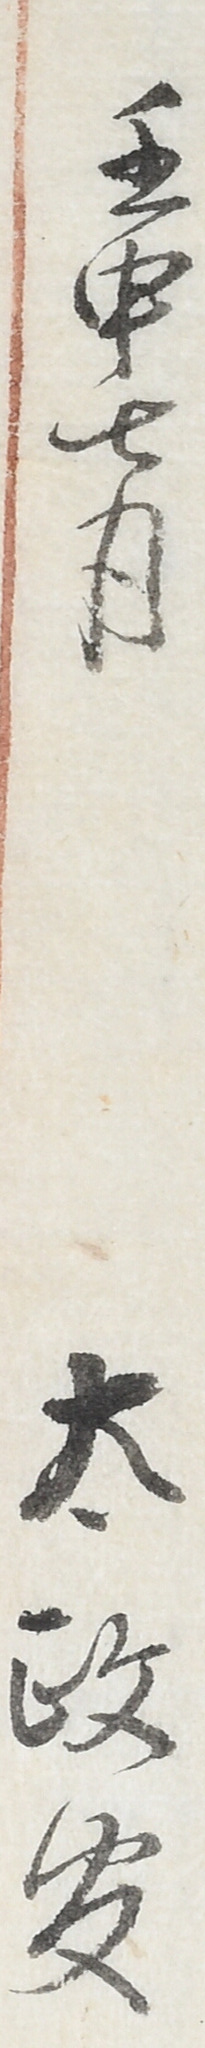壬申七月太政官
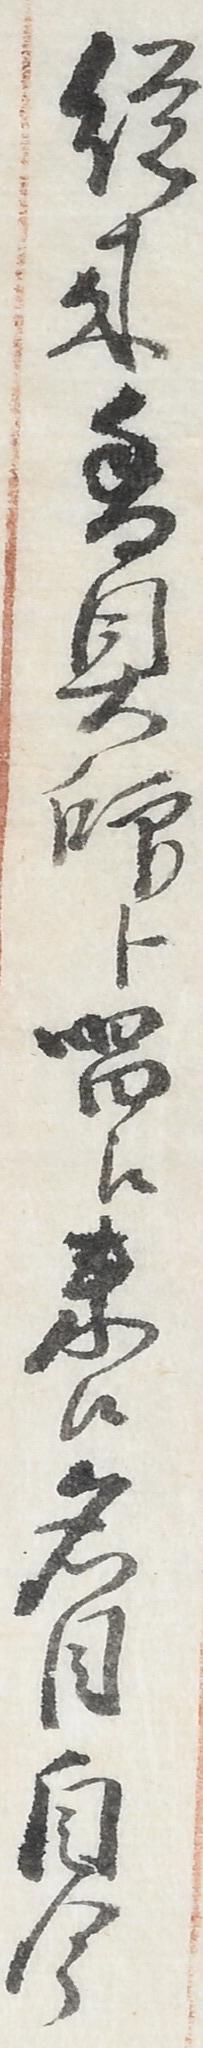従来香具師と唱え来候名目自今
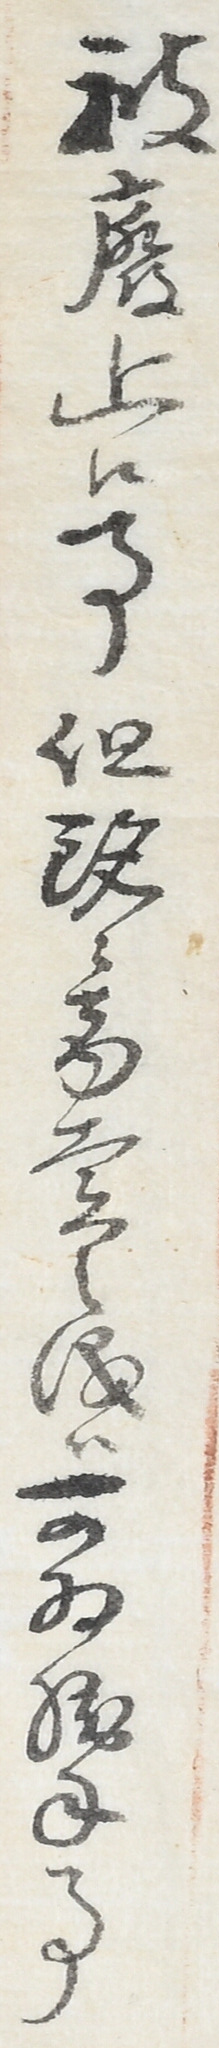被廃止候事但銘々商売之儀は可為勝手事

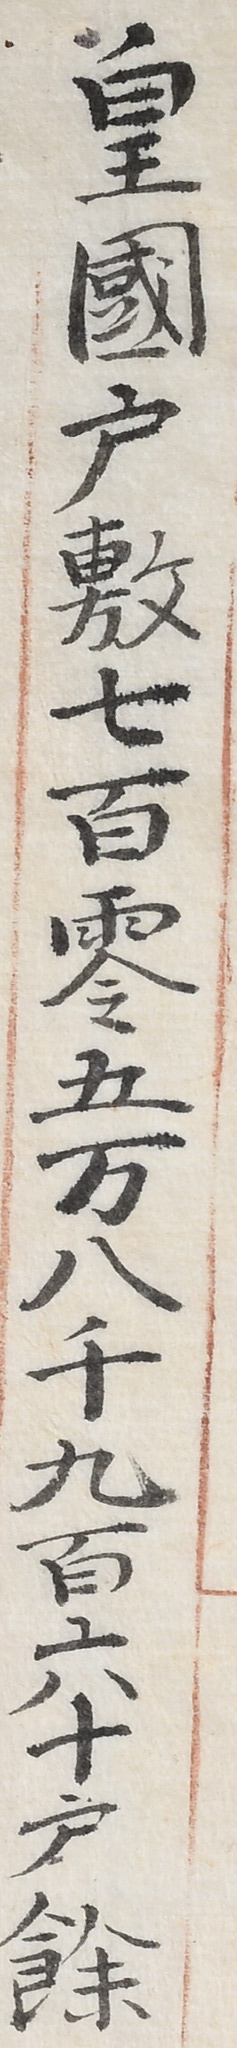皇国戸数七百零五万八千九百六十戸余
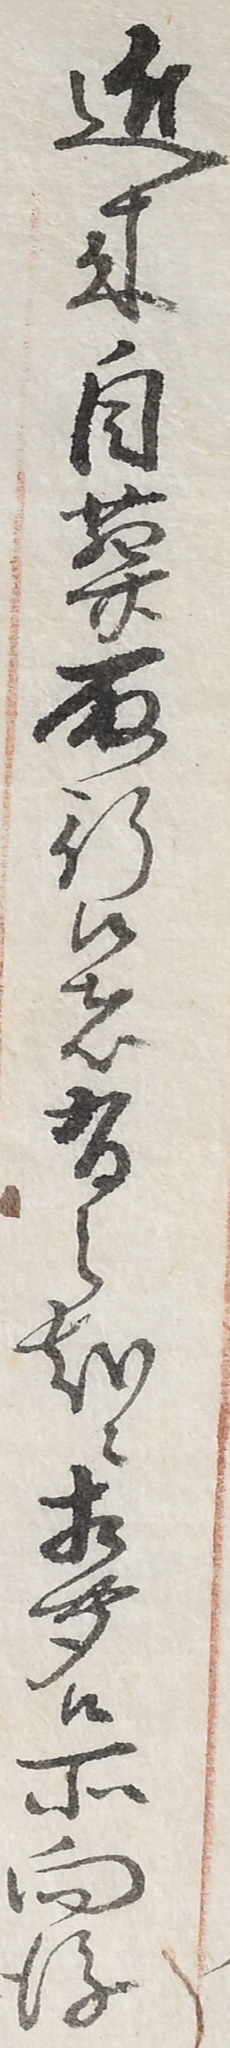近来自葬取行候者有赴ニ相聞候所向後
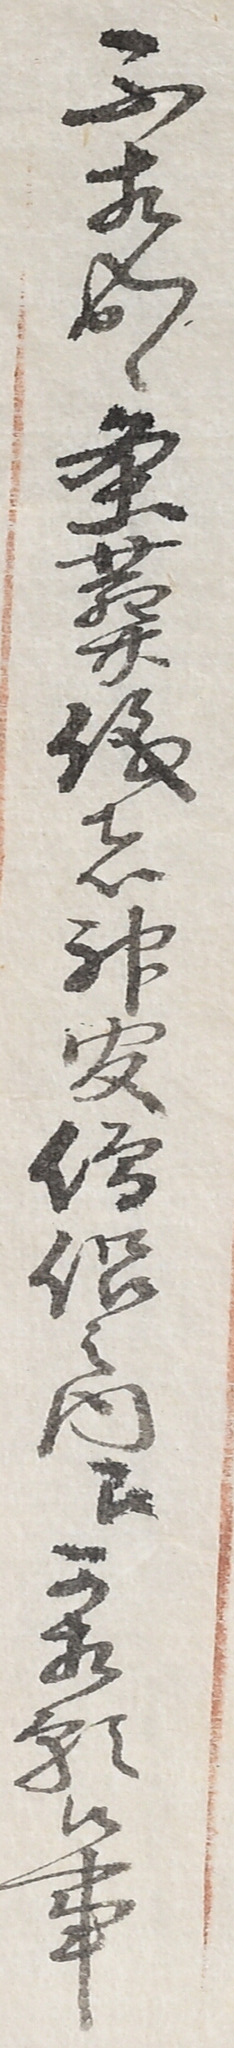不相成候条葬儀は神官僧侶之内え可相願候事
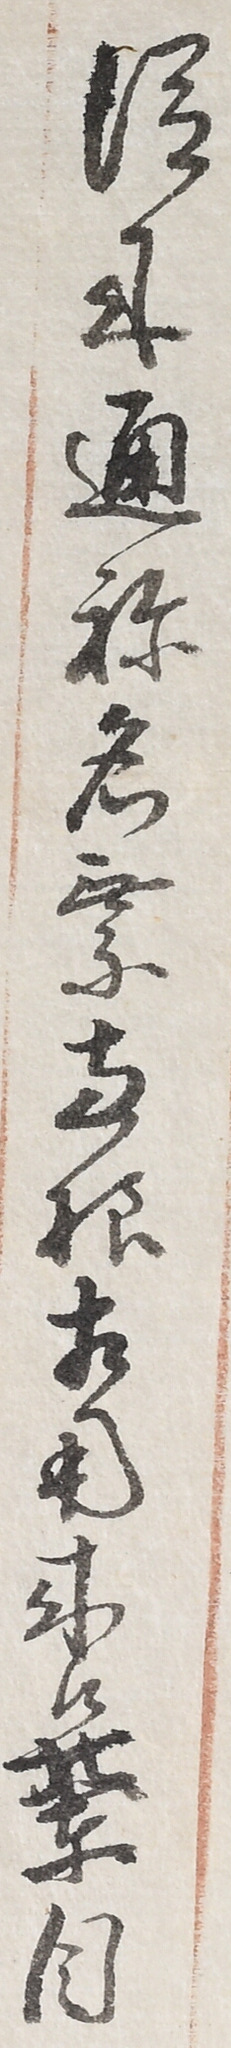従来通称名乗両様相用来ル輩自
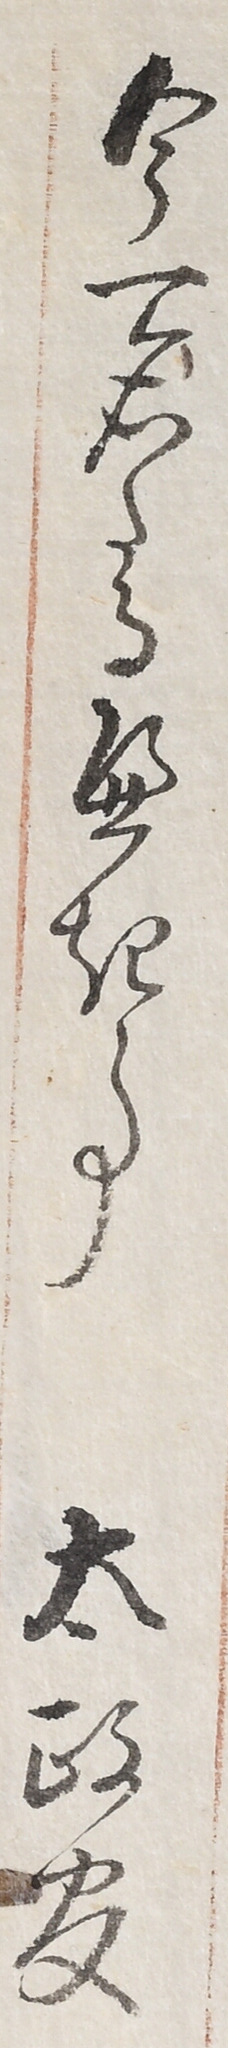今一名たるへき事太政官
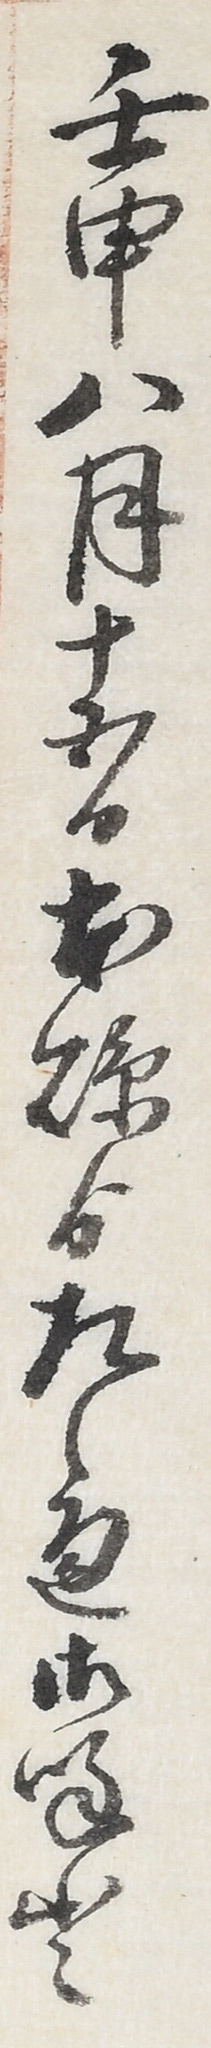壬申八月十五日本県より左之通御呼出
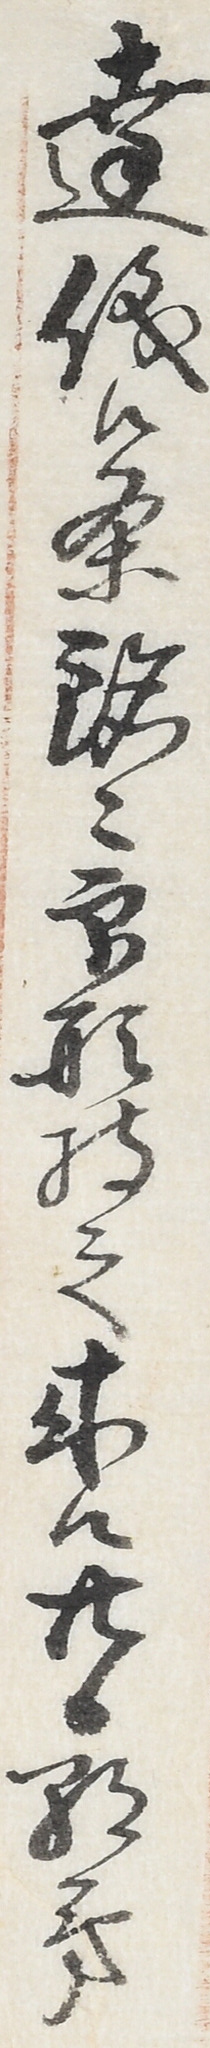達儀候条銘々印形持之来ル廿日朝第
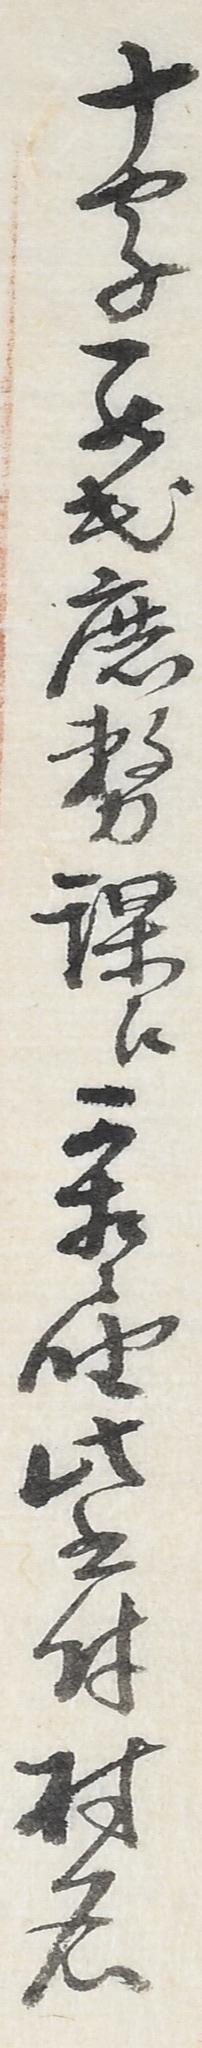十字罷出庶務課え可相届此書付村名
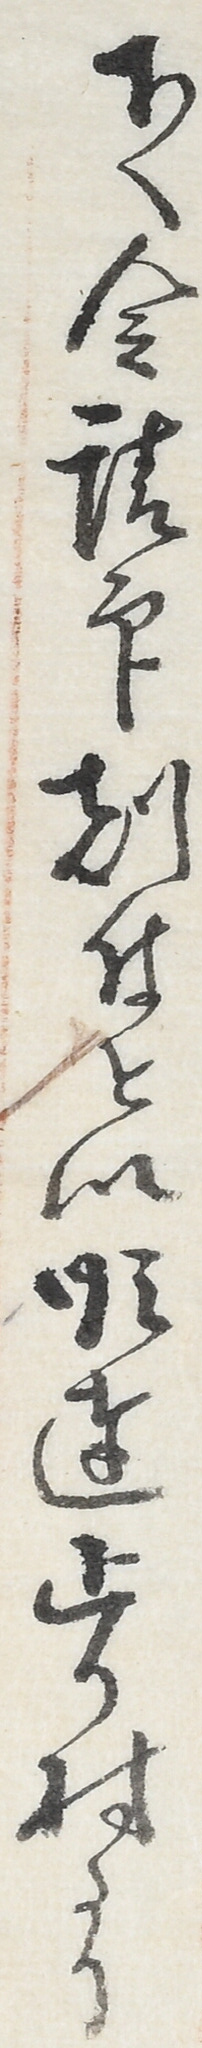下へ令請印刻付を以順達止り村より

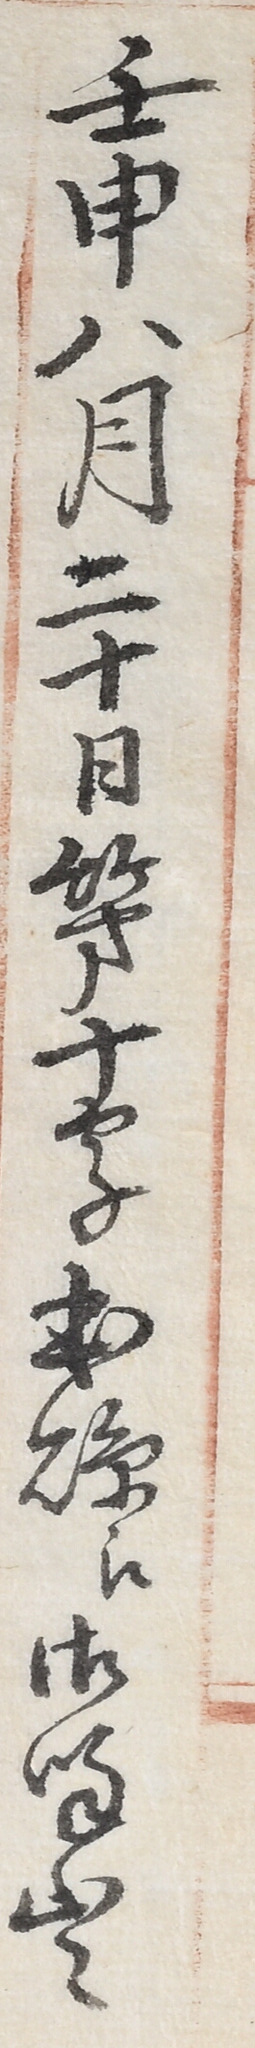壬申八月廿日第十字本県え御呼出
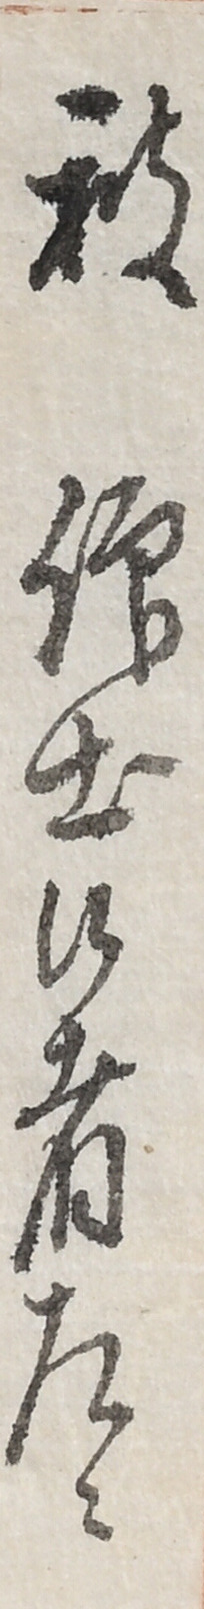被仰出候者左ニ
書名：壹番・御布告一式
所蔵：伊那市立高遠町図書館・合同会社AMANE
